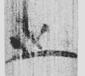之
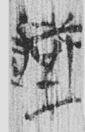○（贓）
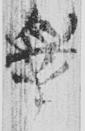辠（罪）
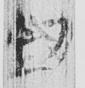型（刑）
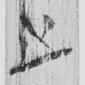之
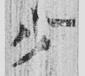少（小）
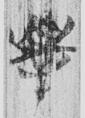辠（罪）
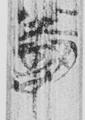罰
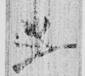之
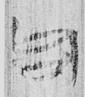句（苟）
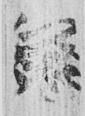能
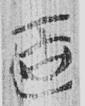固
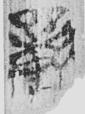獸（守）
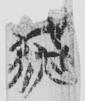○（滅）
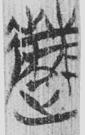速
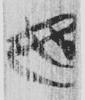母
